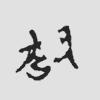旬
